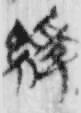緩
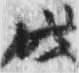戊
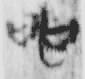申
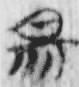昜
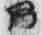尹
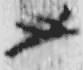之
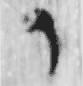人
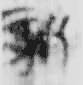新
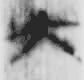大
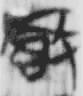○（厩）
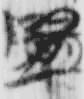○（陽）
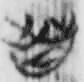晉
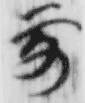亥
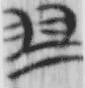翏
